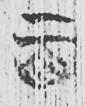百
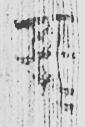五十=
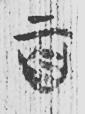百
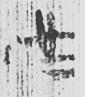廿=
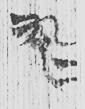九十=
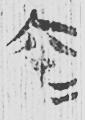六十=
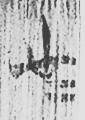卅=
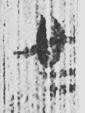廿=
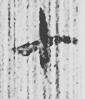七
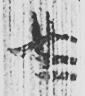廿=
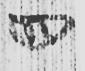四
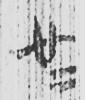廿=
